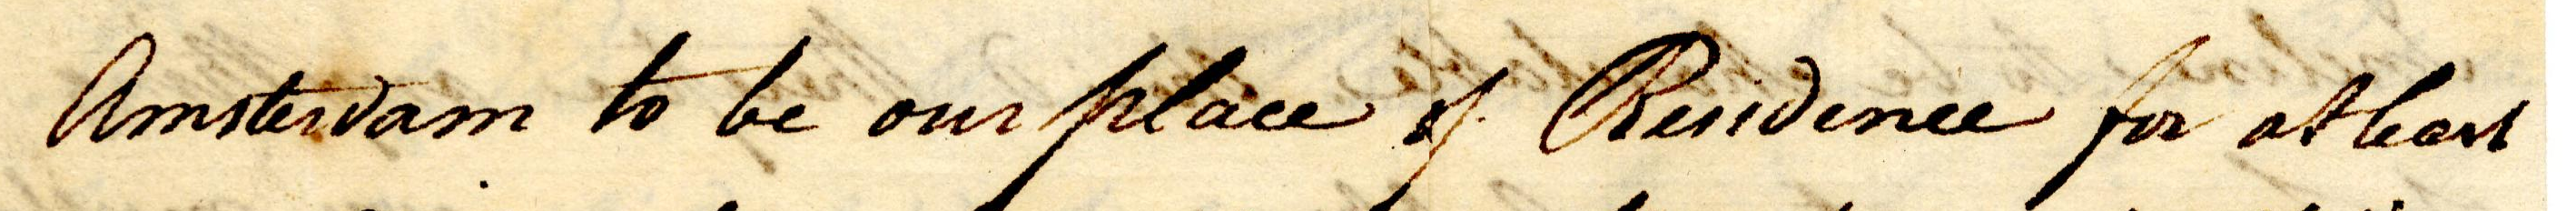Amsterdam to be our place of Residence for at least
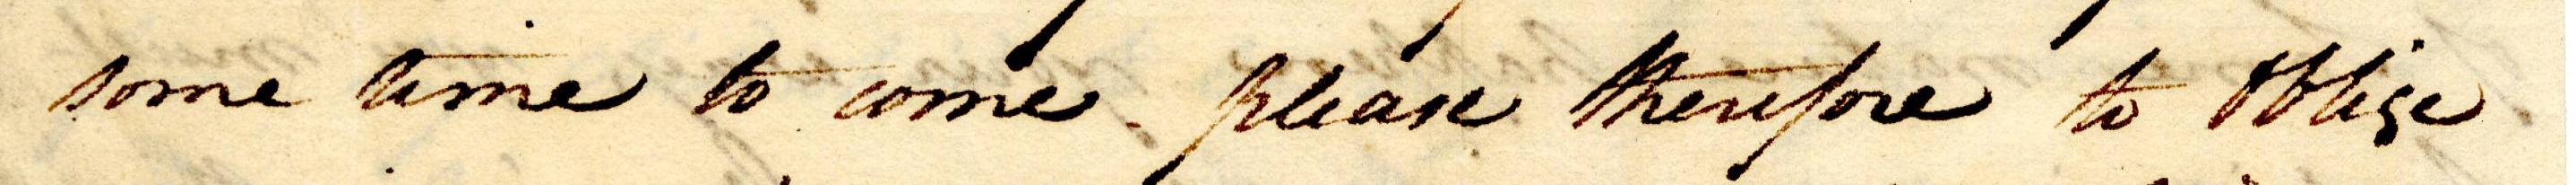some time to come. please therefore to oblige
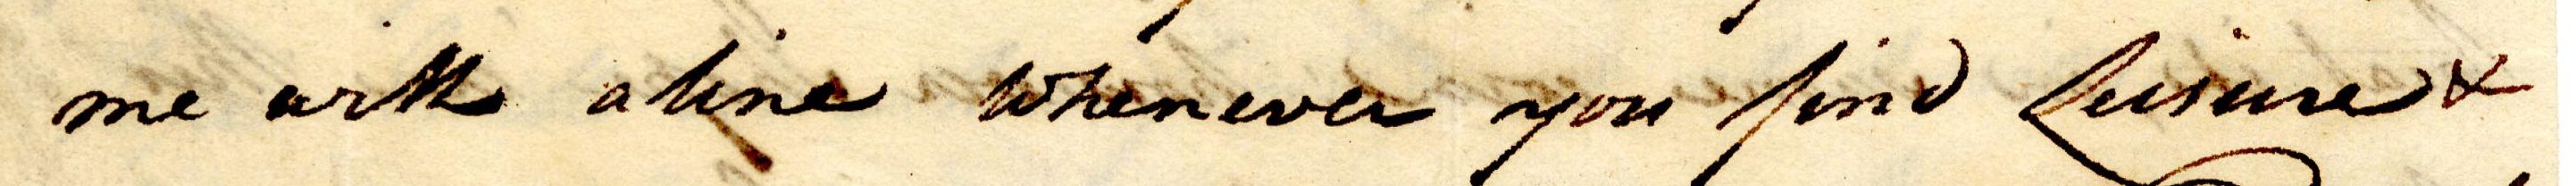me with a time whenever you find Leisure &
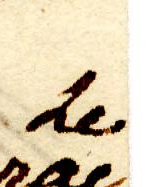de
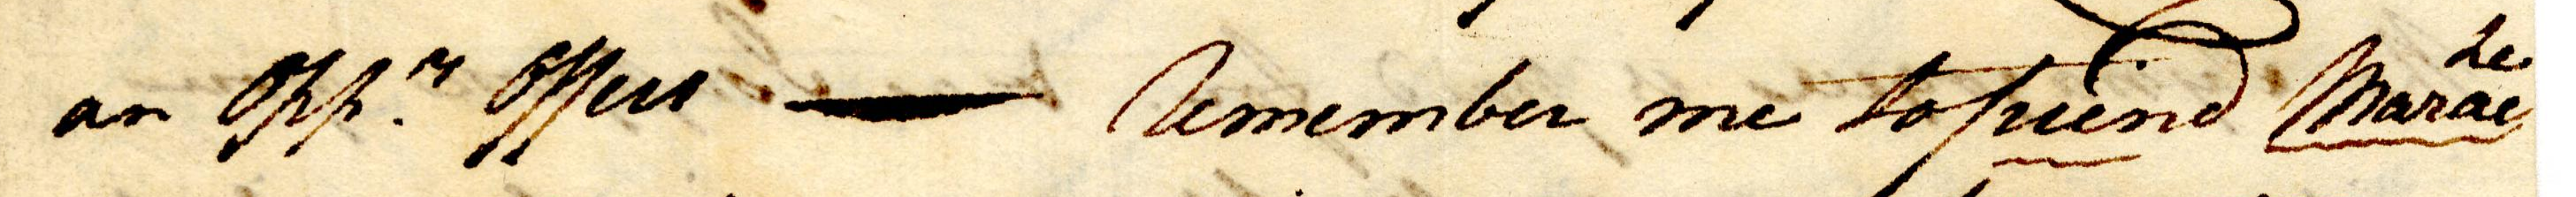an Opp^y Offers- remember me to friend Marae-
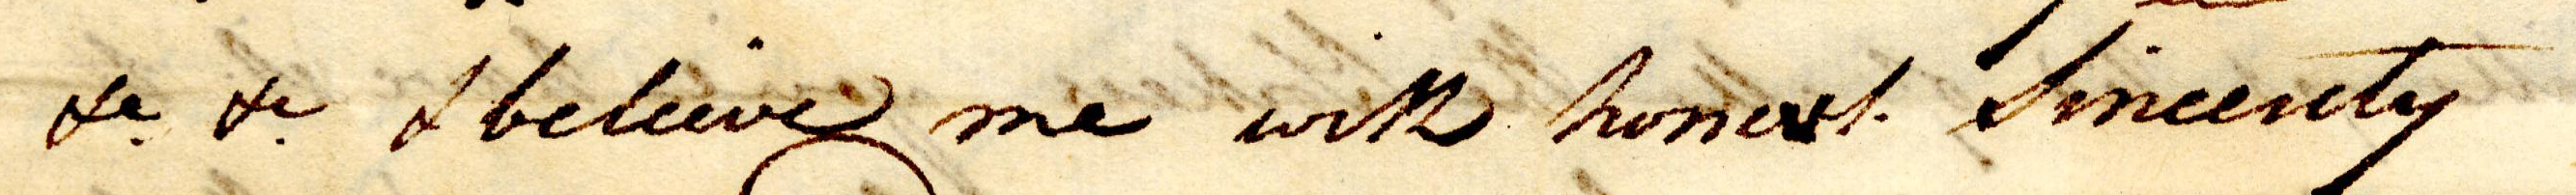&c. &c. & believe me with honest Sincerity
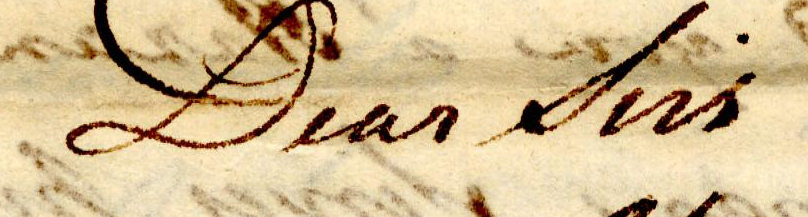Dear Sirs
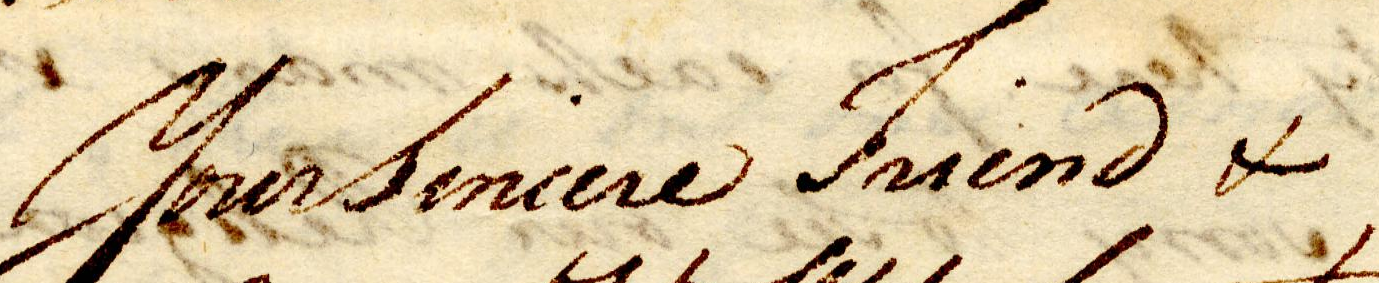Your Sincere Friend &
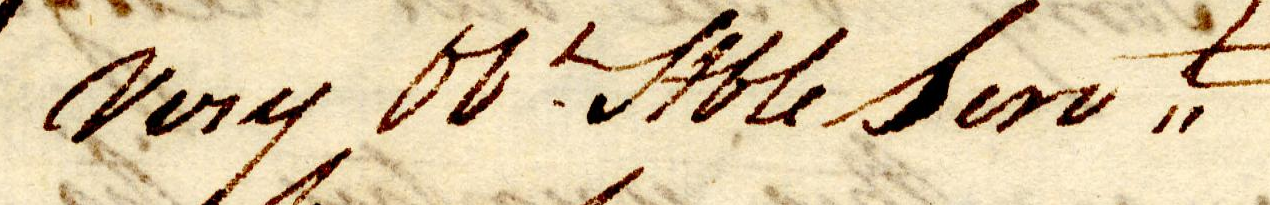Very Ob^t. Hble. Serv^t.
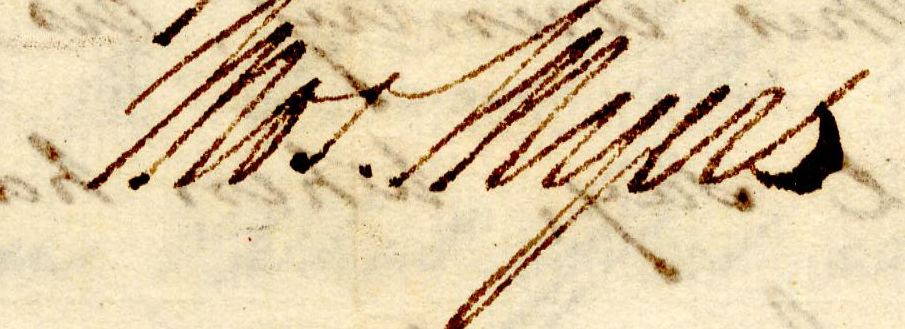Mos. Myers
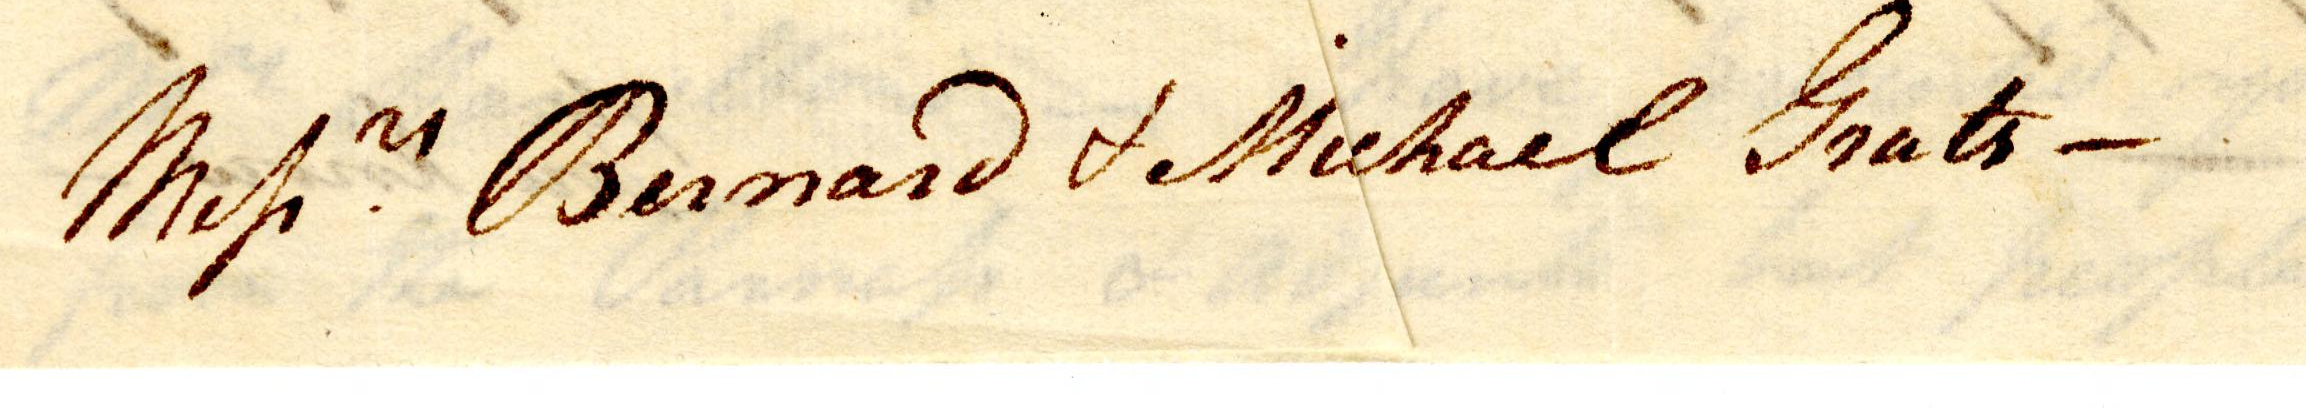Mess^rs. Bernard & Muhael Grats-
